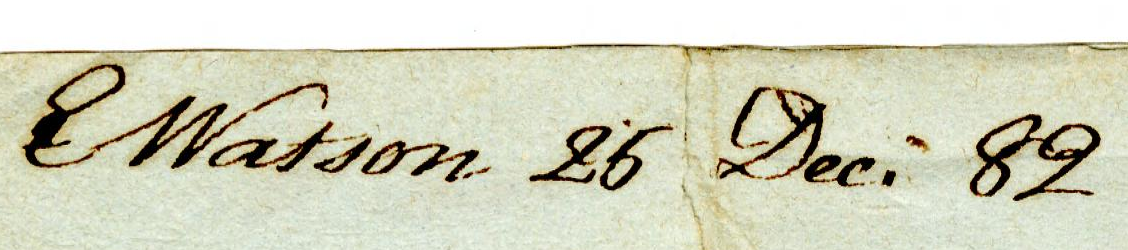E Watson 26 Dec. 82
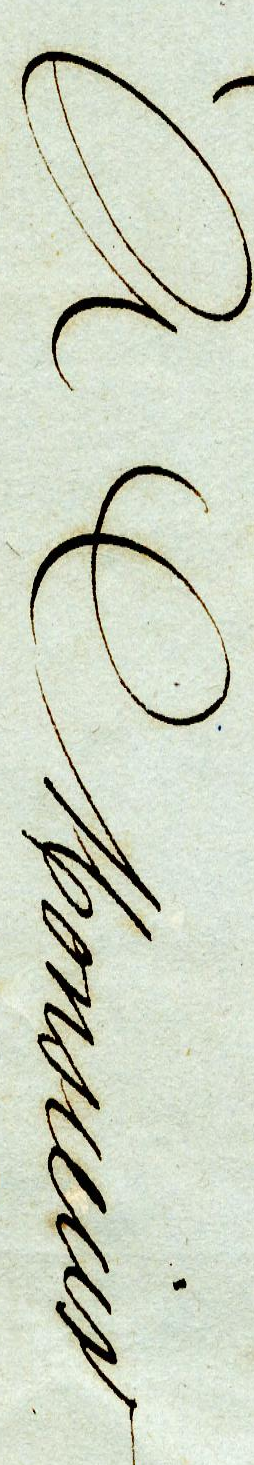À Monsieur
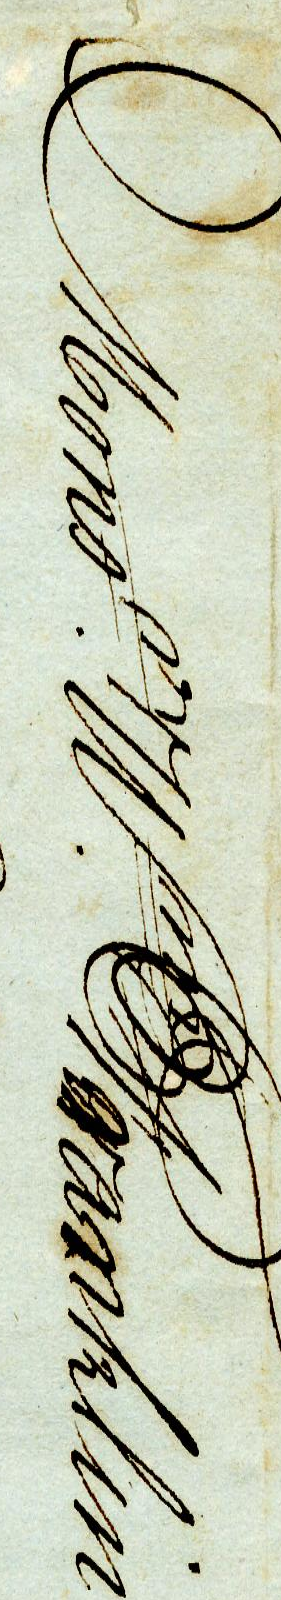Mons^r. W^m. Franklin
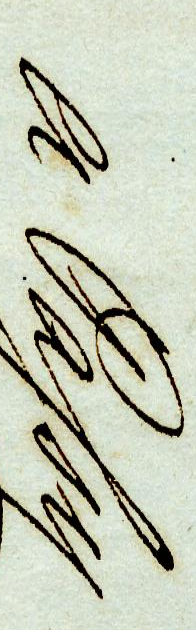a Passy
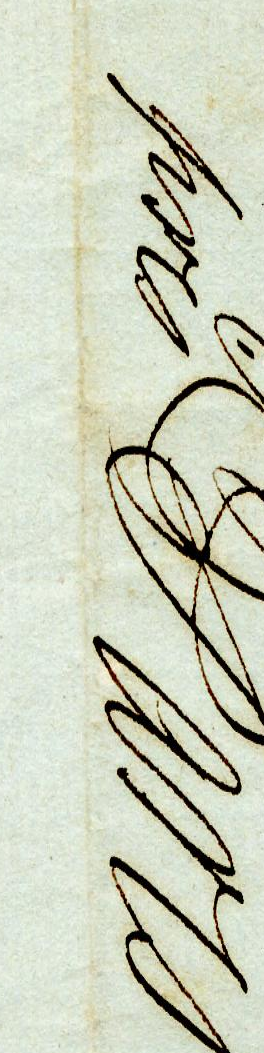pres Paris
